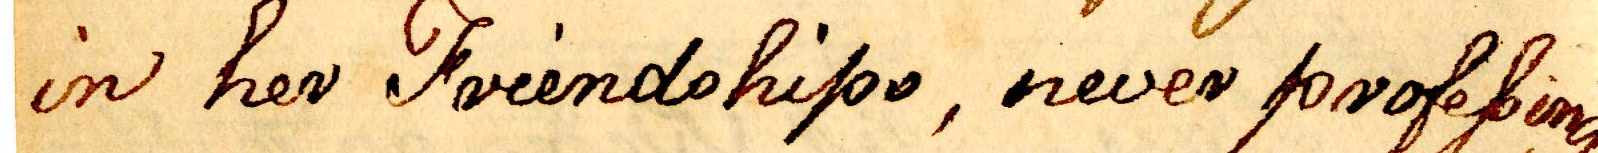in her Friendships, never professing
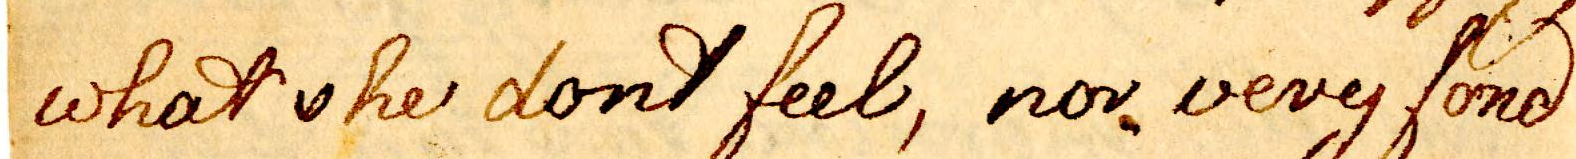what she dont feel, nor, very fond
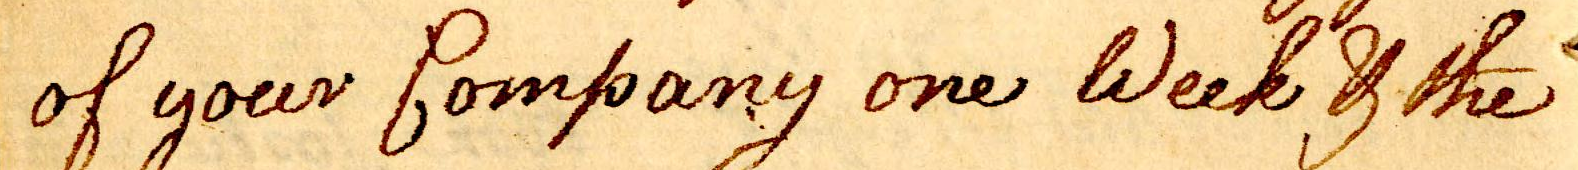of your Company one Week & the
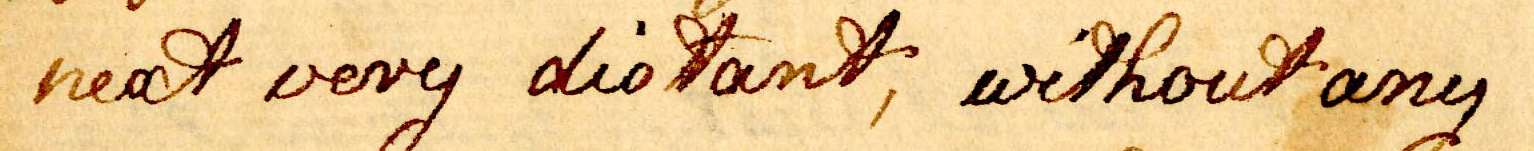next very distant, without any
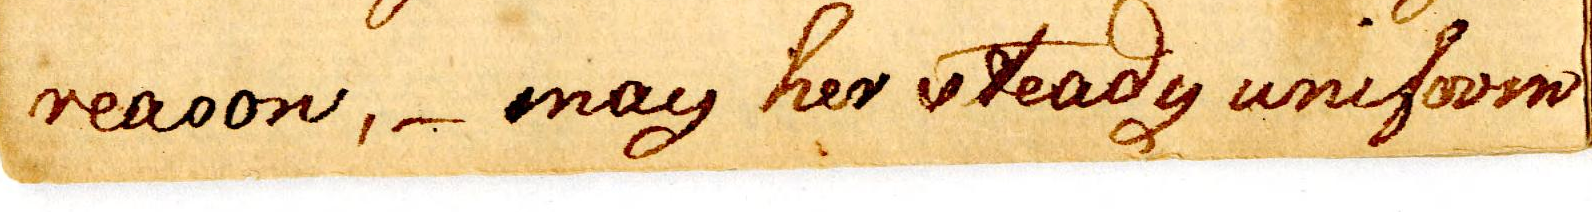reason,- may her steady uniform
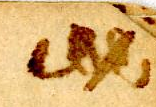31
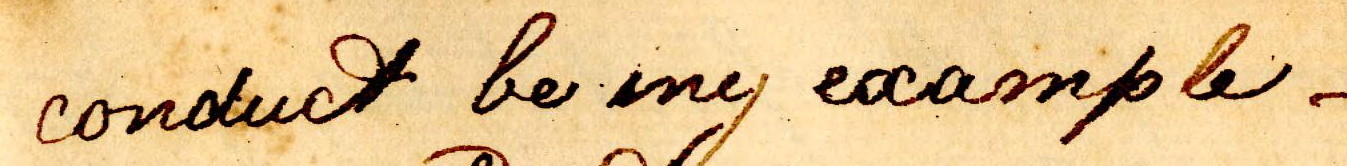conduct be my example-
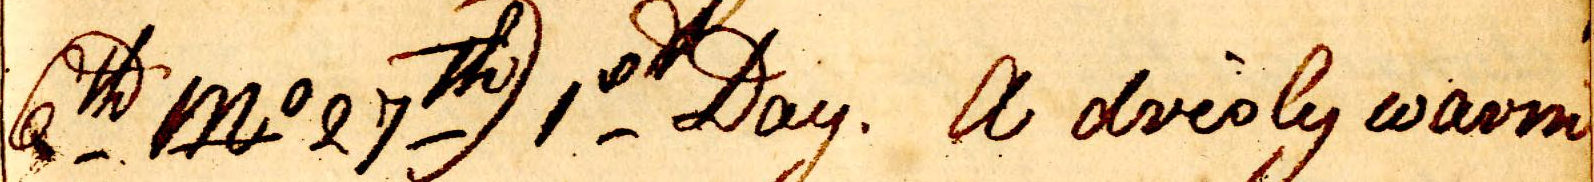6^th M^o 27^th) 1^st Day. A drisly warm
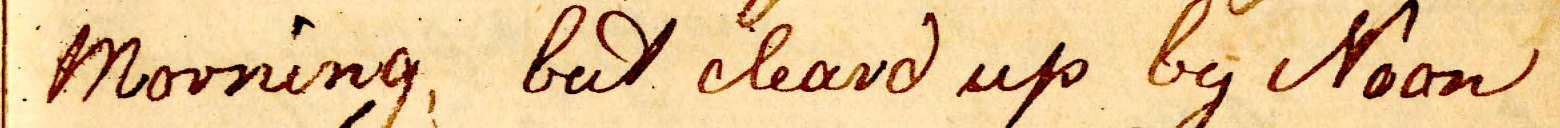Morning, but cleard up by Noon
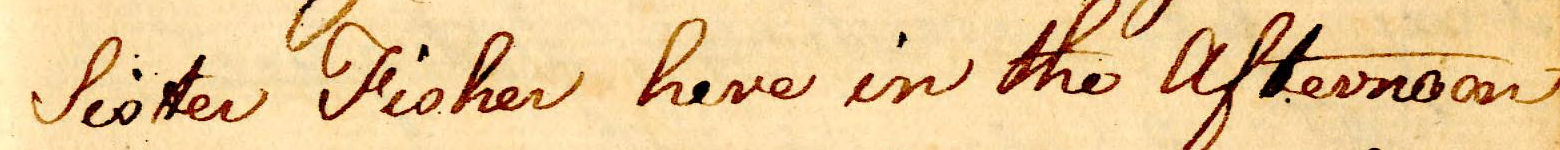Sister Fisher here in the Afternoon
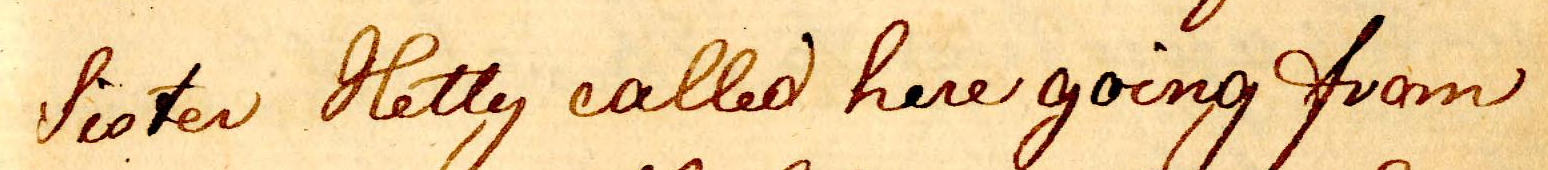Sister Hetty called here going from
